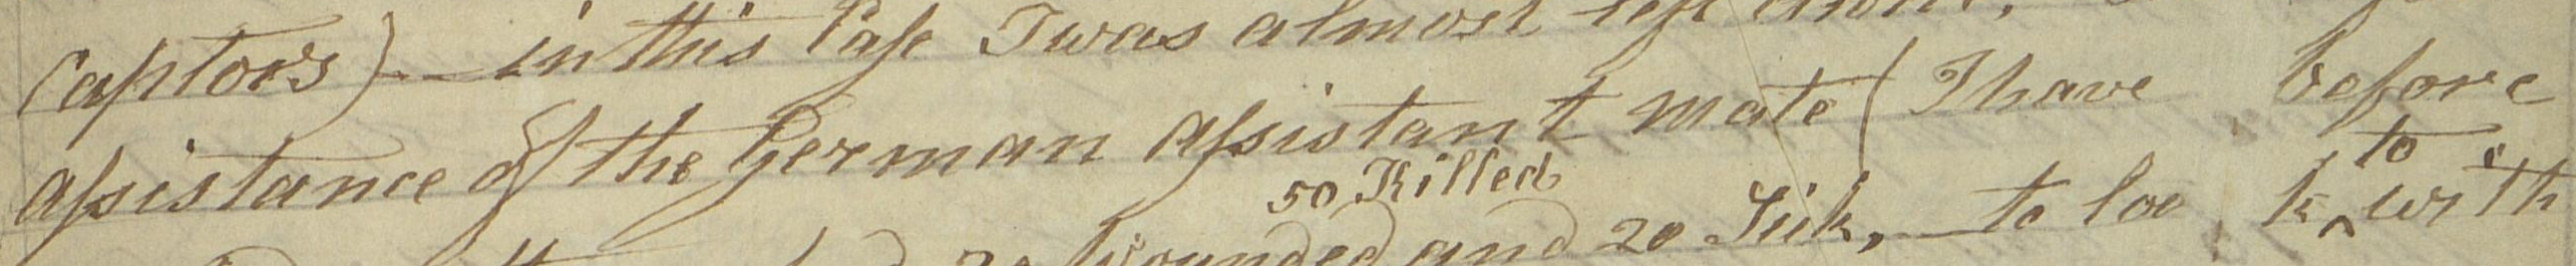assistance of the German assistant mate (I have before
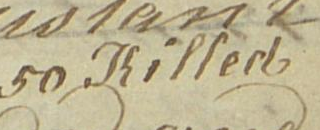50 Killed
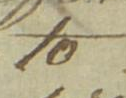to
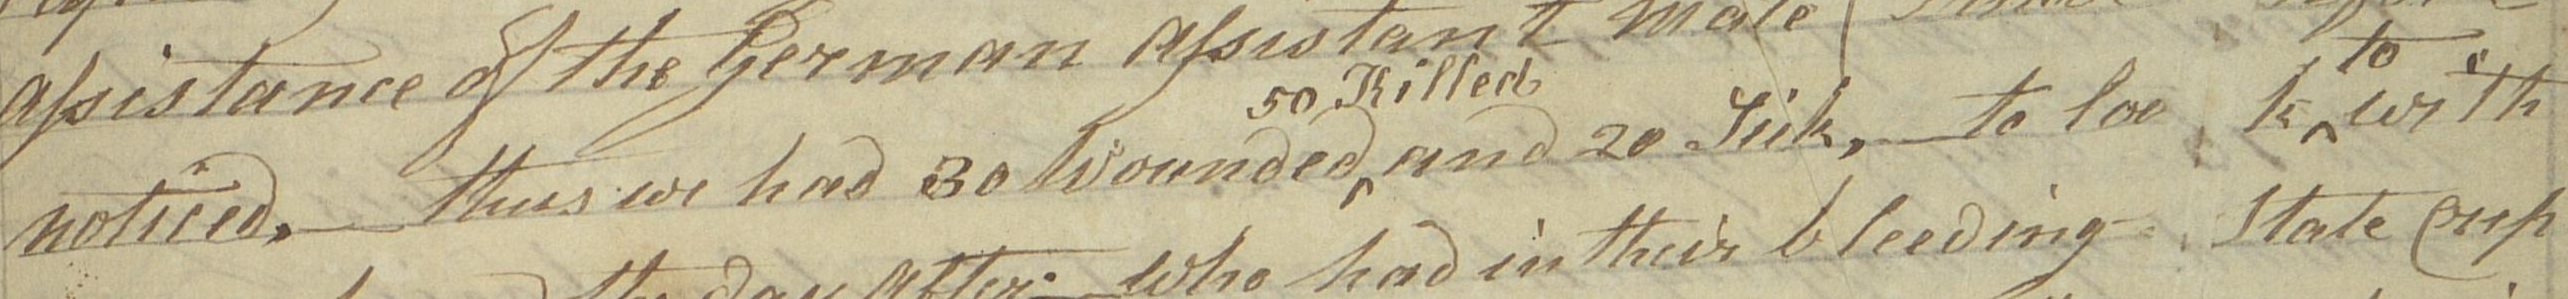noticed. thus we had 30 Wounded ^ and 20 Sick, to lo- k ^ with
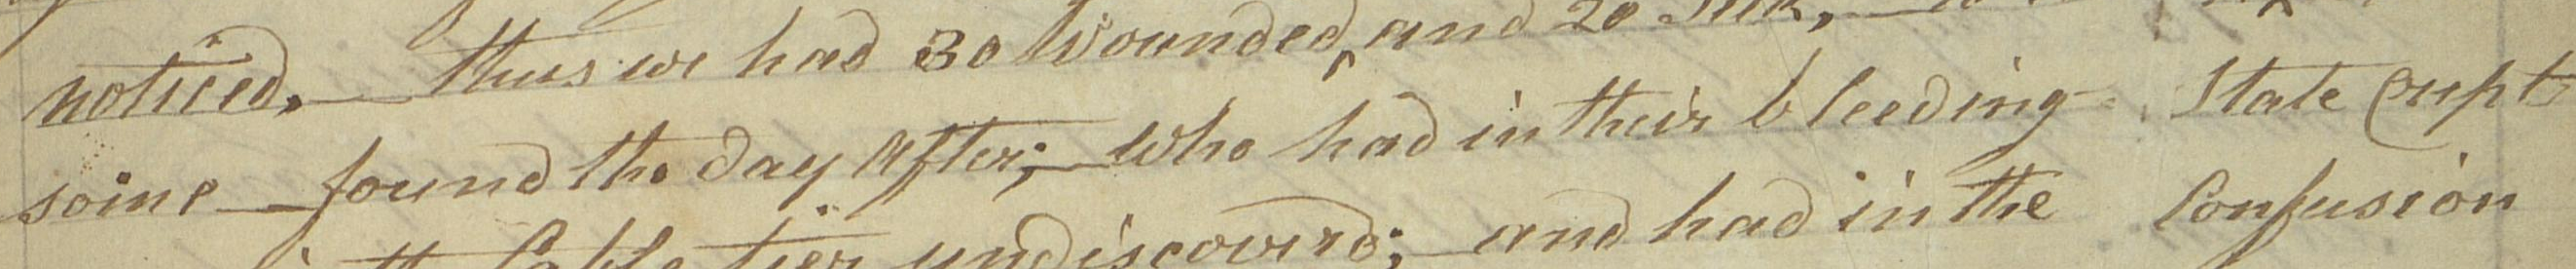some found the day After; who had in their bleeding State Crept
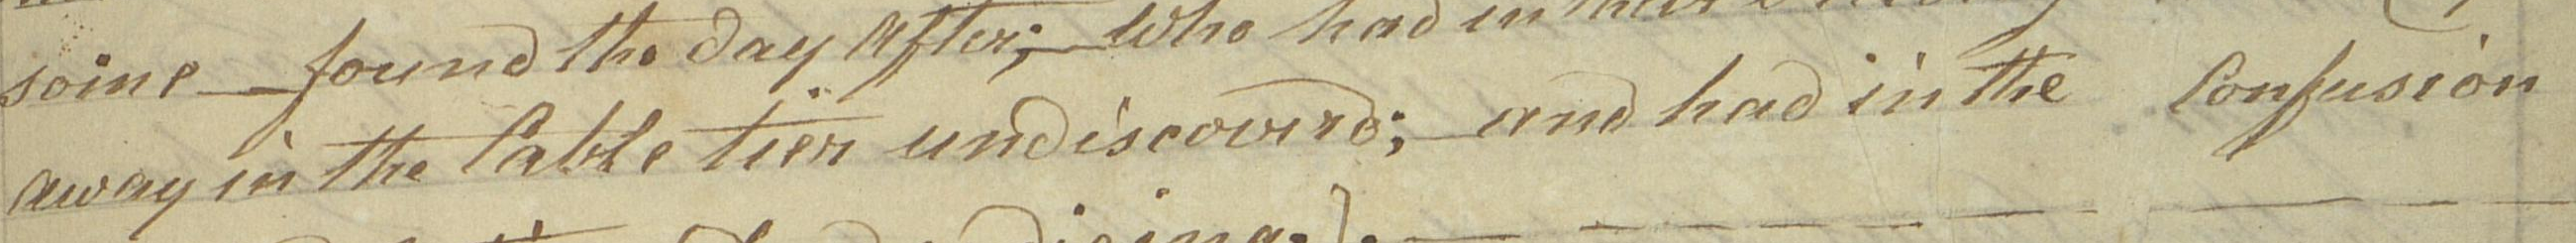away in the Cable tier undiscoverd; and had in the Confusion
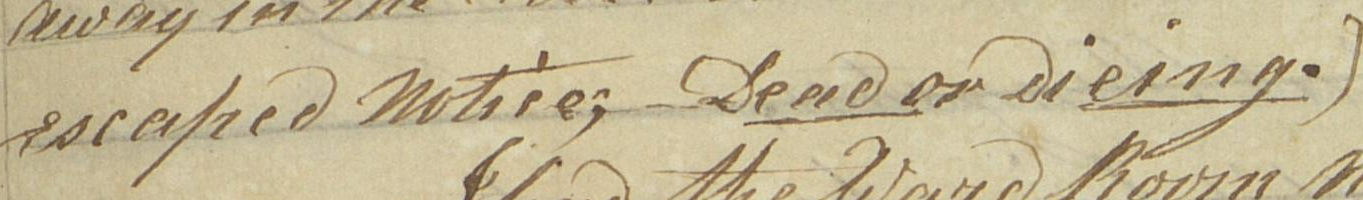escaped Notice, Dead or dieing.)
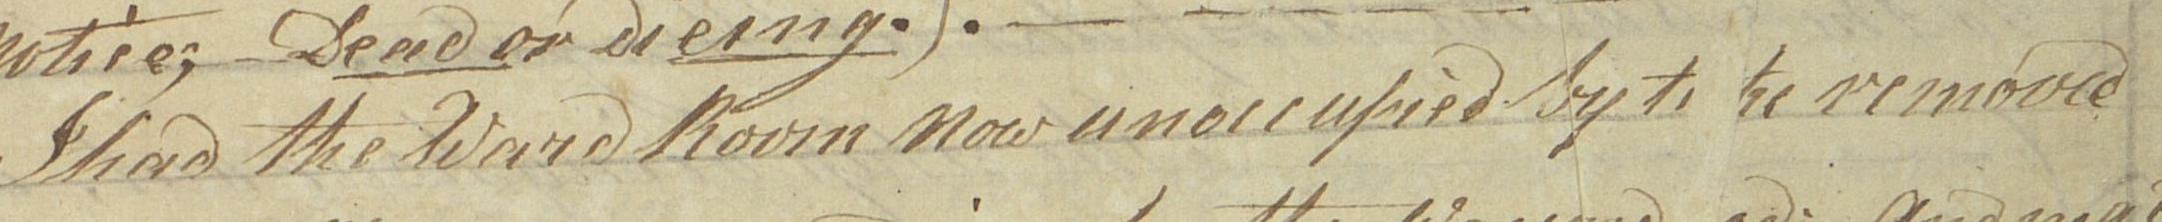I had the ward Room now unoccupied by to be removed
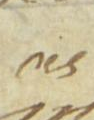as
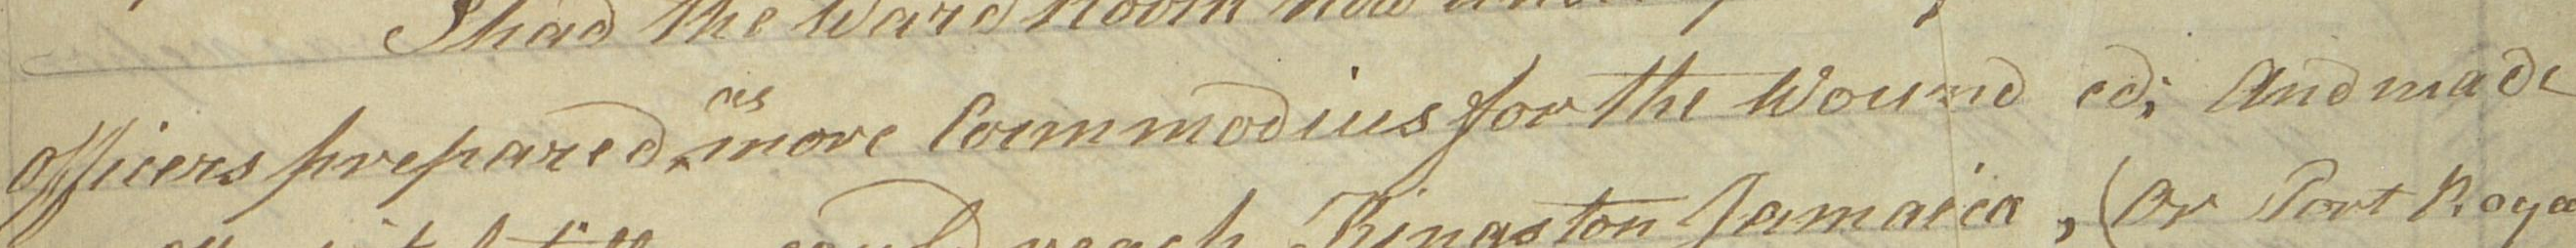officers prepared ^ more commodious for the Wound -ed: And made
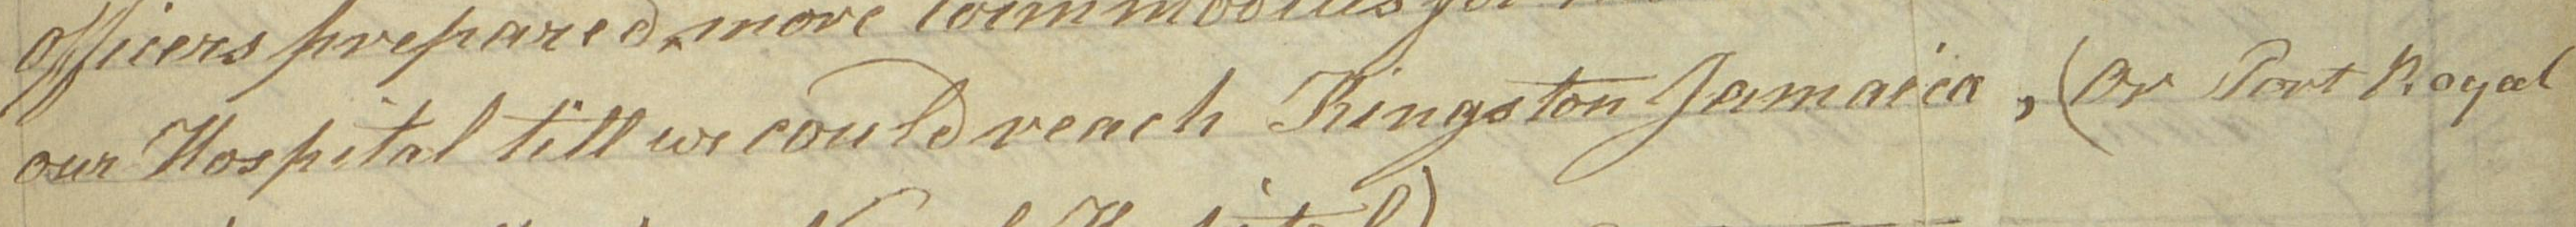our Hospital till we could reach Kingston Jamaica, (Or Port Royal
